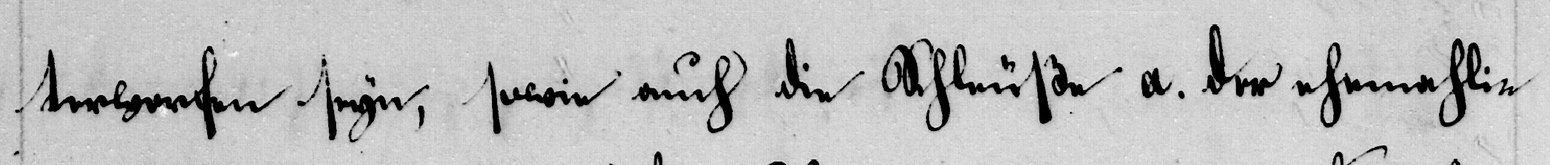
terworfen seyn, sowie auch die Schleuße a. der ehemali¬
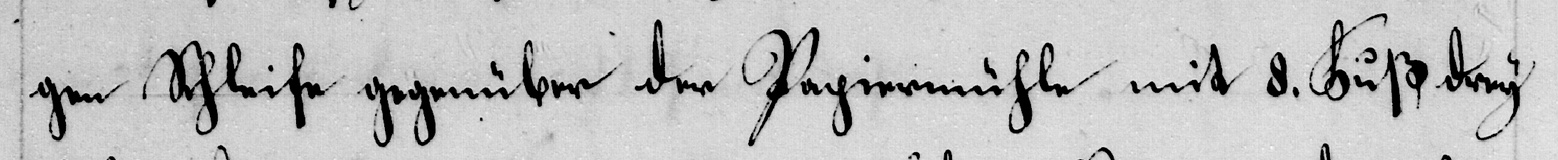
gen Schleife gegenüber der Papiermühle mit 8. Fuß drey
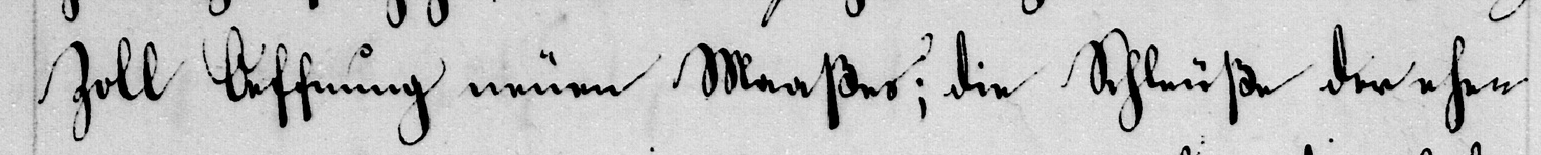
Zoll Oeffnung neuen Maaßes; die Schleuße der ehe¬
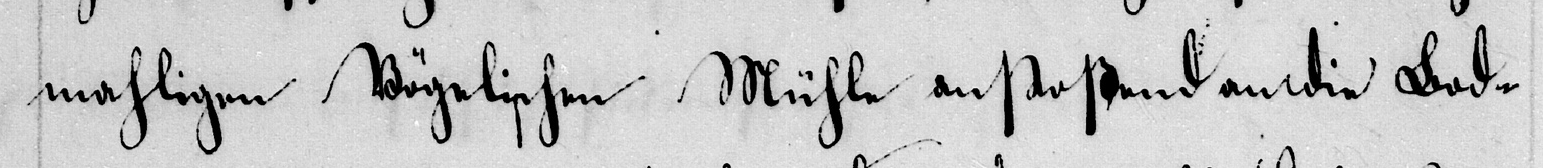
mahligen Vögelischen Mühle anstoßend an die Bod¬
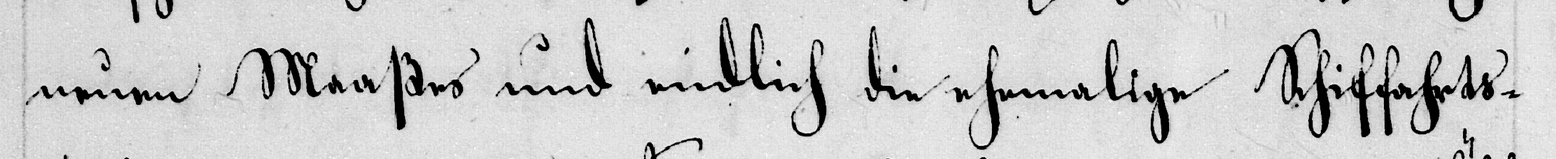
neuen Maaßes und endlich die ehemalige Schiffahrts¬
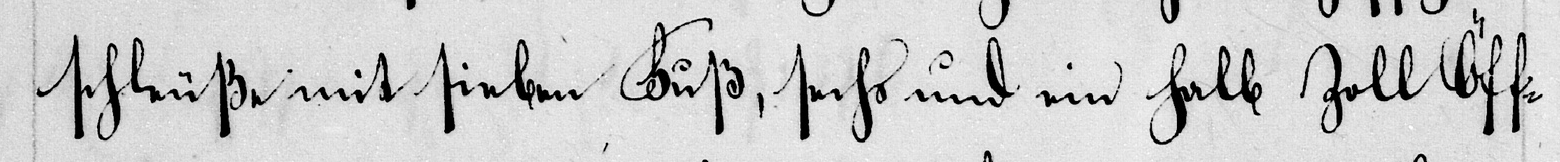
schleuße mit sieben Fuß, sechs und ein halb Zoll Öff¬
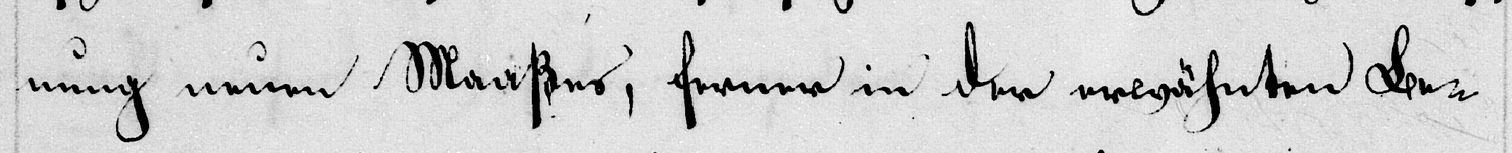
nung neuen Maaßes, ferner in der erwähnten Be¬
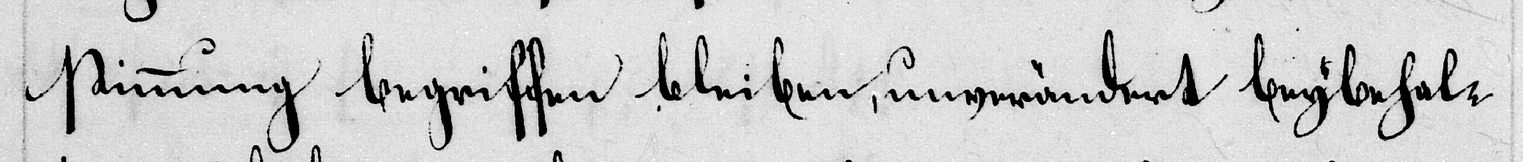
stimmung begriffen bleiben, unverändert beybehal¬
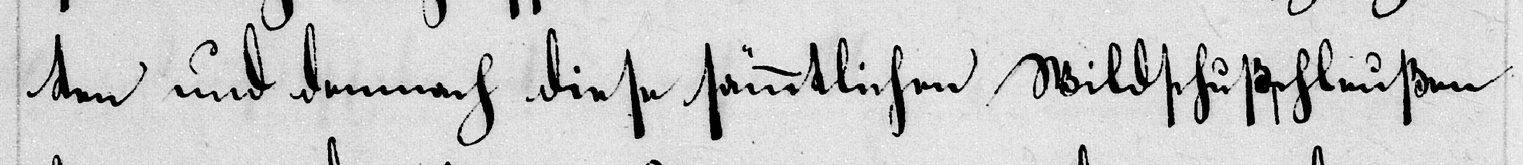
ten und demnach diese sämmtlichen Wildschußschleußen
